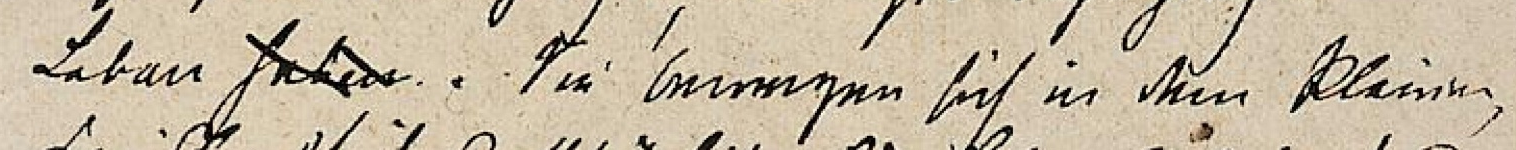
Leben haben. Sie bewegen sich in dem kleinen
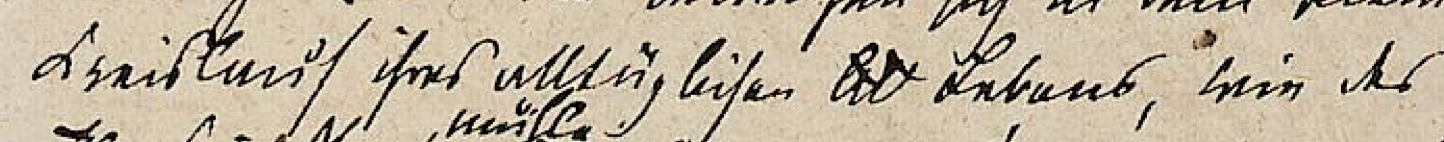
Kreislauf ihres alltäglichen All Lebens, wie des
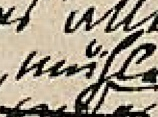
mühle
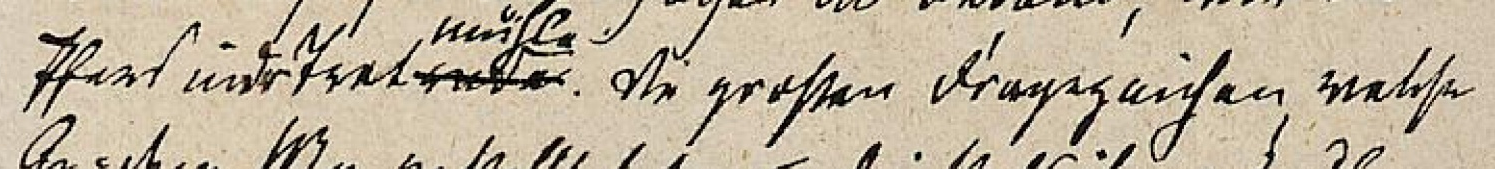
Pferd in der Tretrade. Die großen Fragezeichen, welche
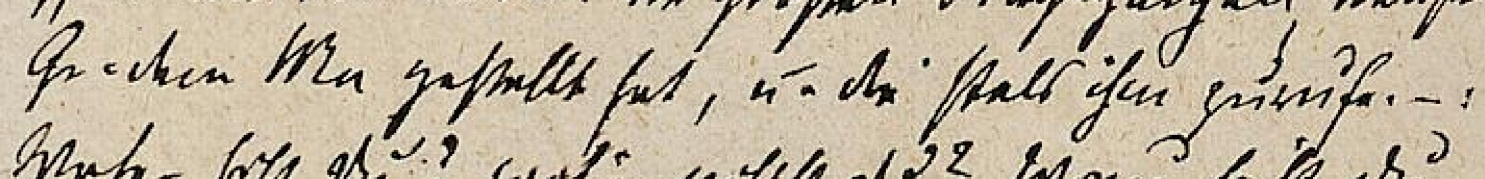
Go. dem Mn gestellt hat, u. die stets ihm zurufen:
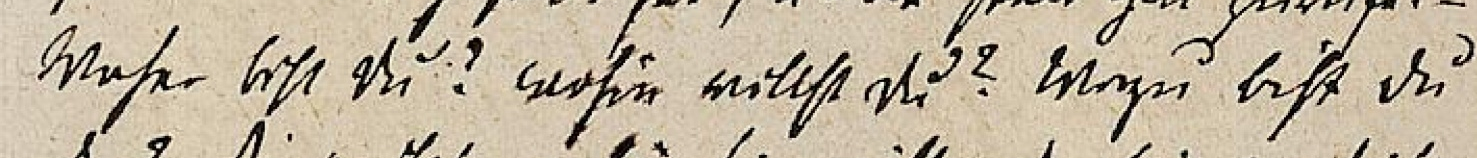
Woher bist du? wohin willst du? Wozu bist du
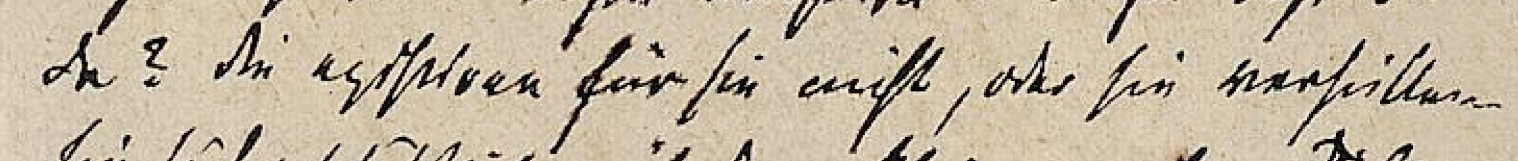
da? Die existiren für sie nicht, oder sie verfüllen
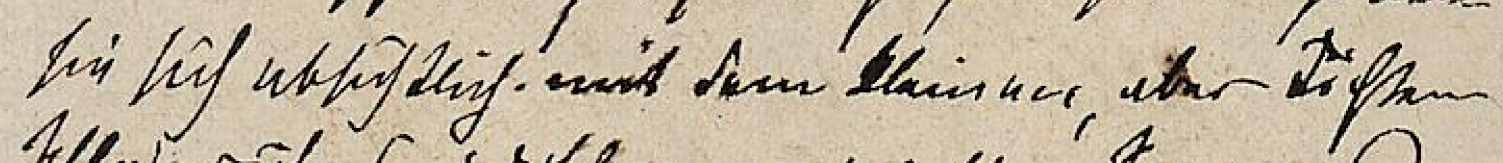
sie sich absichtlich mit dem kleinen, aber düstern
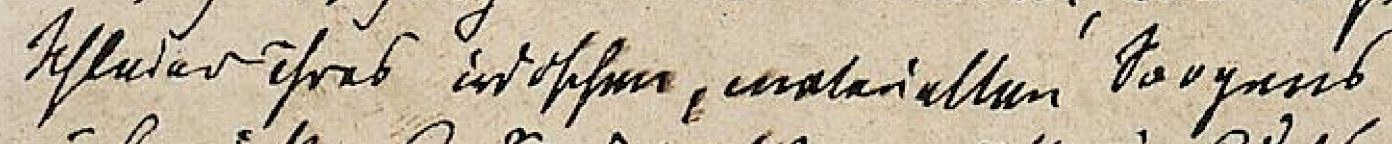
Schleier ihres irdischen, materiellen Sorgens
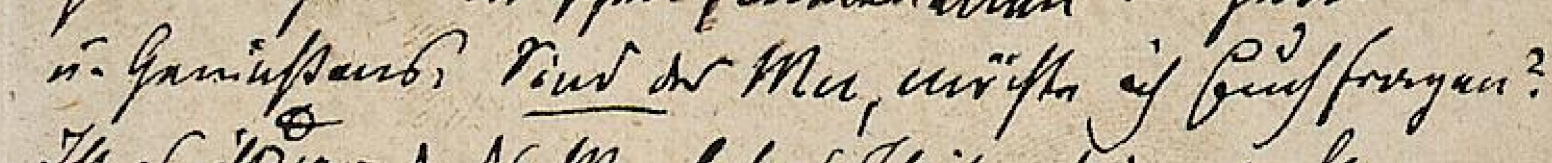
u. Genießens. Sind ds Mn, möchte ich Euch fragen?
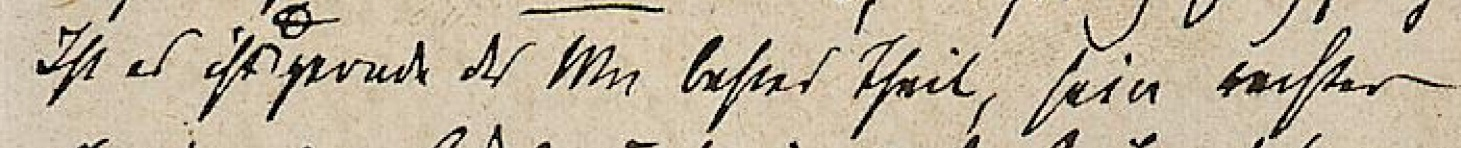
Ist es ist gerade des Mn bestes Theil, sein rechter
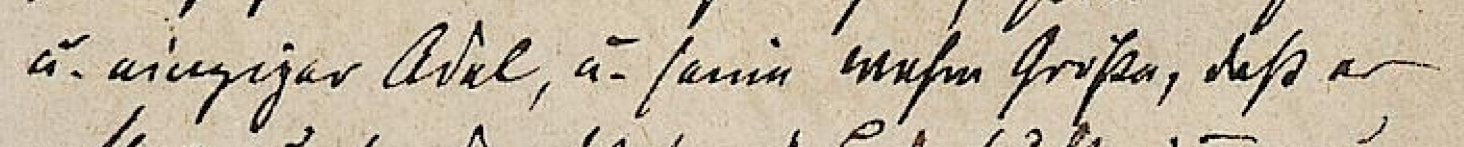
u. einziger Adel, u seine wahm Größte, daß er
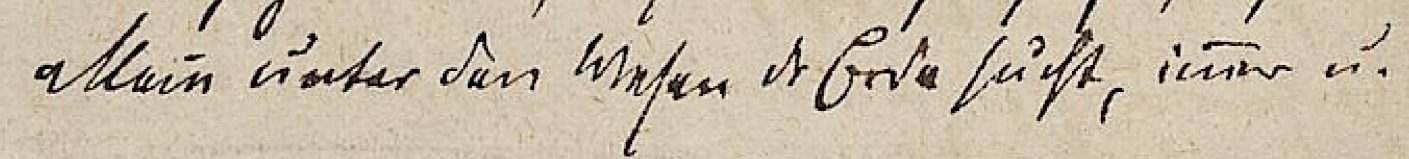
allein unter den Wesen dr Erde sucht, imer u
